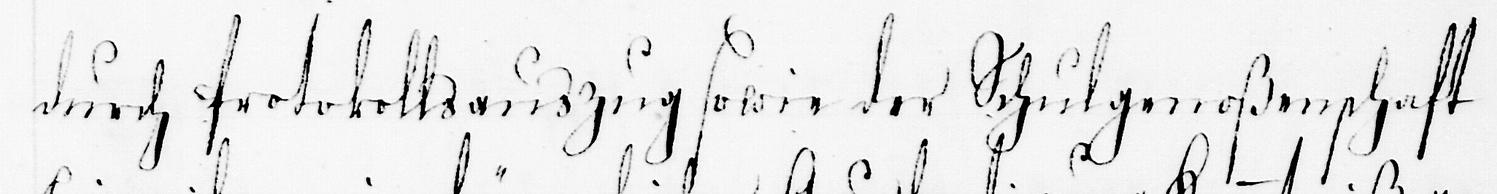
durch Protokollsauszug sowie der Schulgenoßenschaft
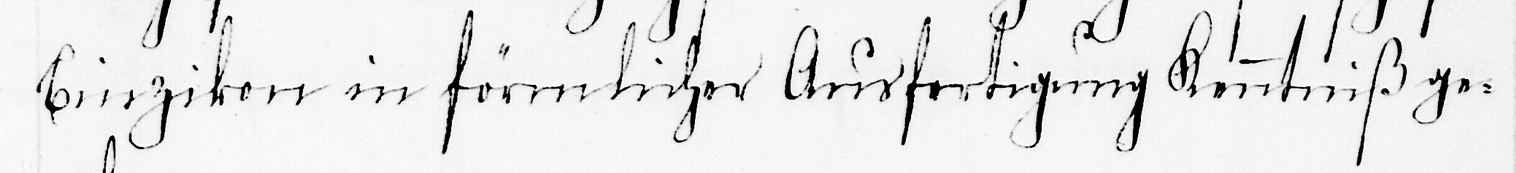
Binzikon in förmlicher Ausfertigung Kenntniß ge¬
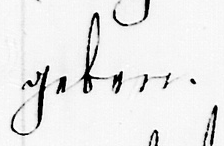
geben.
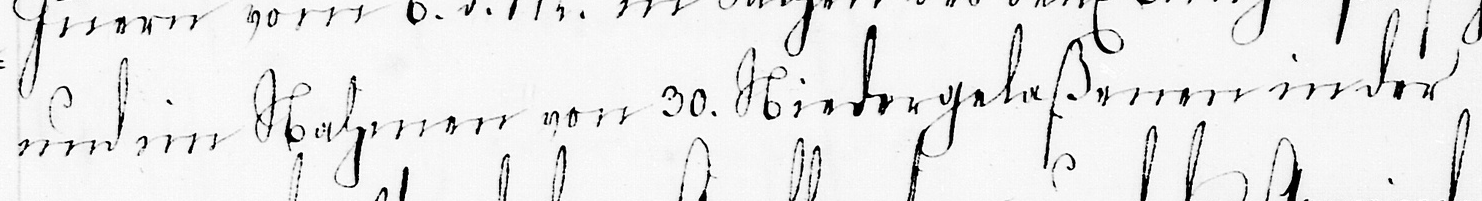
und im Nahmen von 30. Niedergelaßenen in der
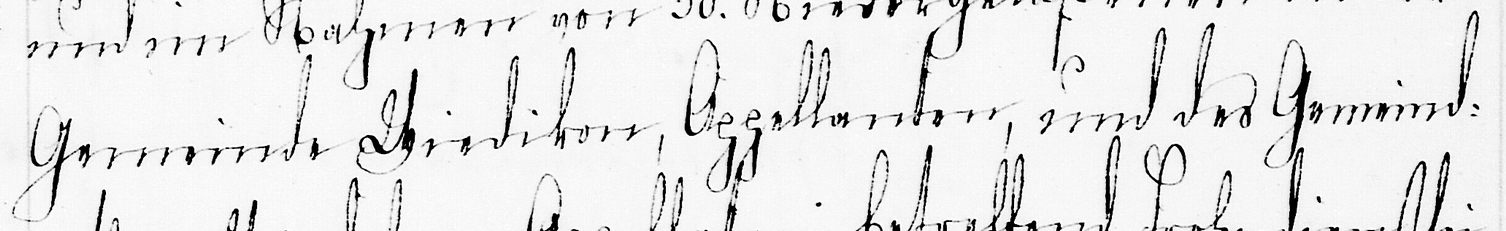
Gemeinde Wiedikon, Appellanten, und des Gemeind¬
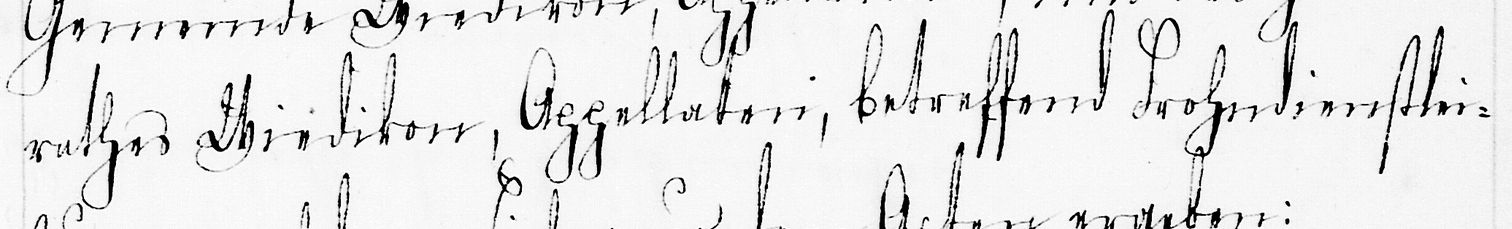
rathes Wiedikon, Appellaten; betreffend Frohndienstlei¬
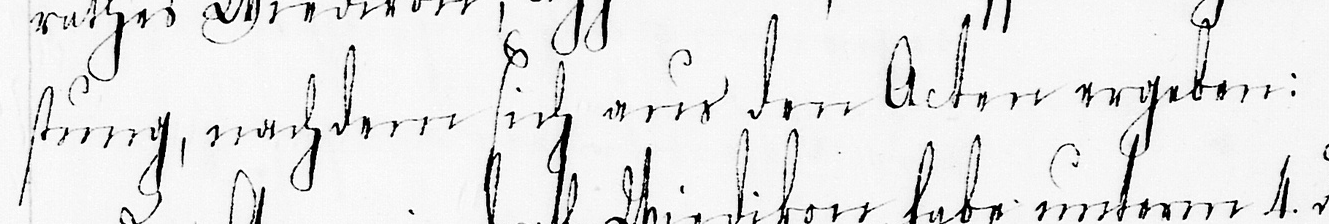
stung, nachdem sich aus den Acten ergeben:
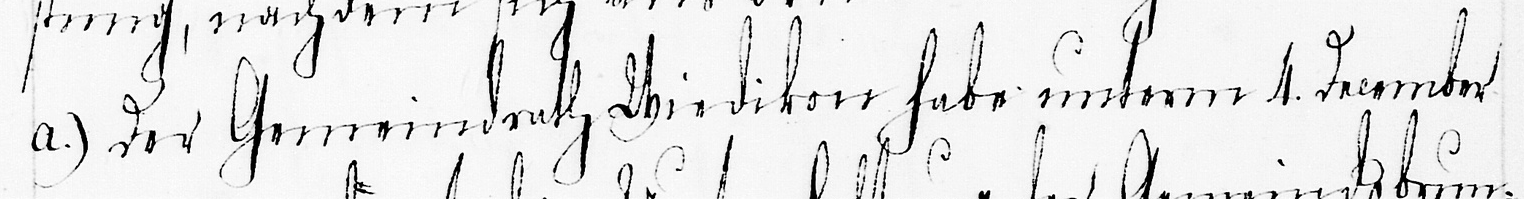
a.) Der Gemeindrath Wiedikon habe unterm 4. December
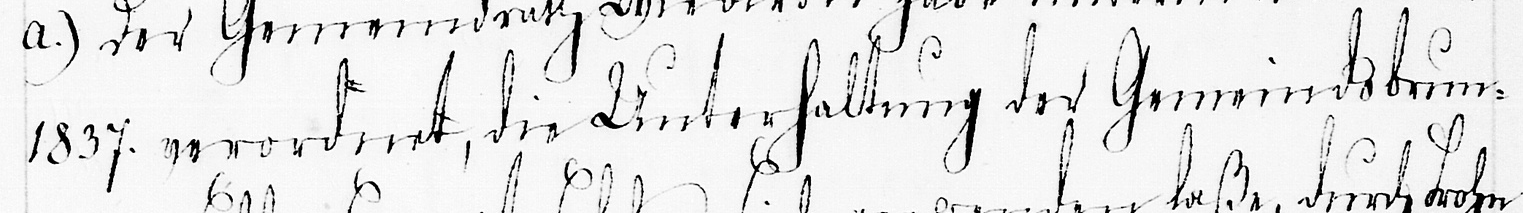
1837. verordnet, die Unterhaltung der Gemeindsbrun¬
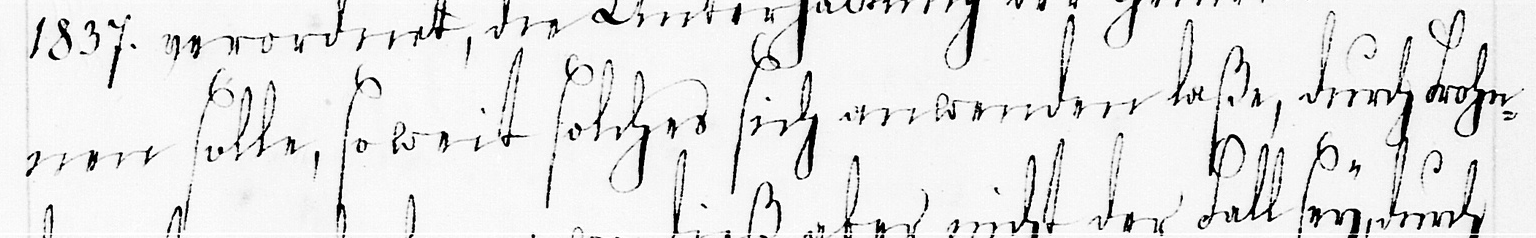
nen solle, soweit solches sich anwenden laße, durch Frohn¬
